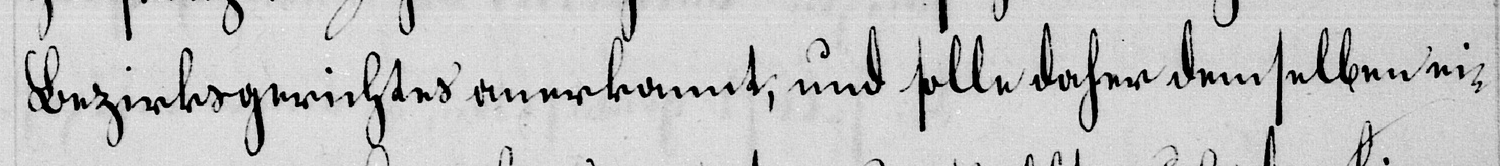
Bezirksgerichtes anerkannt, und solle daher demselben ei¬
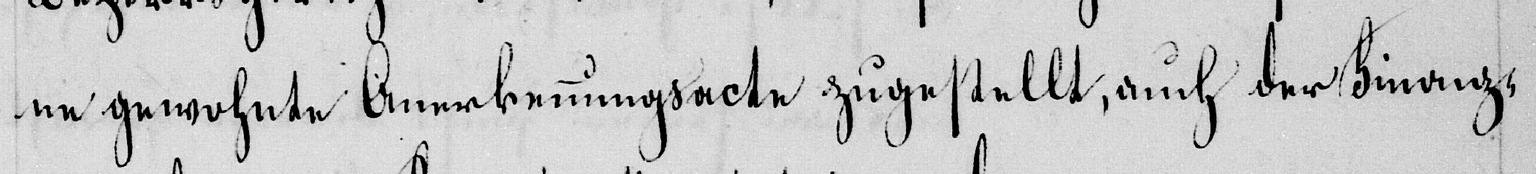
ne gewohnte Anerkennungsacte zugestellt, auch der Finanz¬
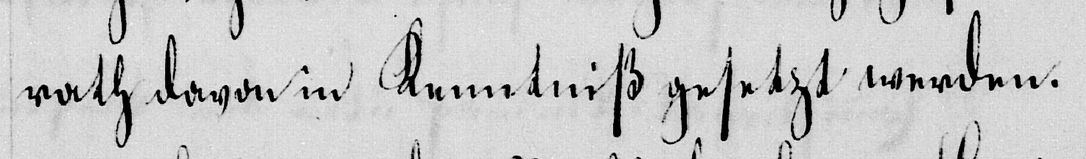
rath davon in Kenntniß gesetzt werden.
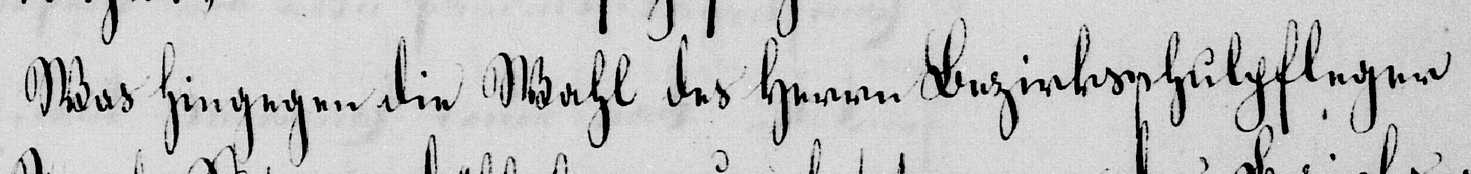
Was hingegen die Wahl des Herrn Bezirksschulpfleger
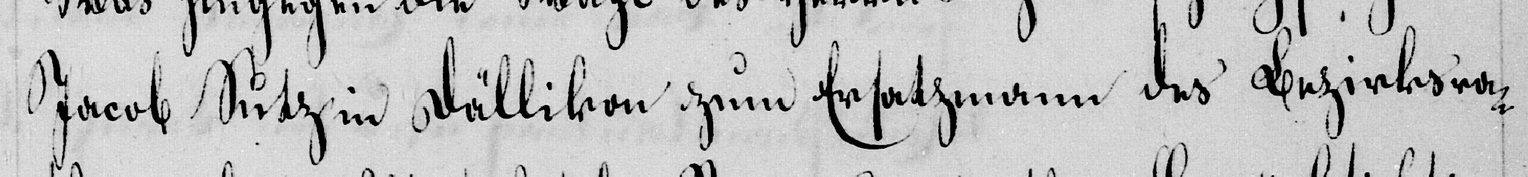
Jacob Sutz in Dällikon zum Ersatzmann des Bezirksra¬
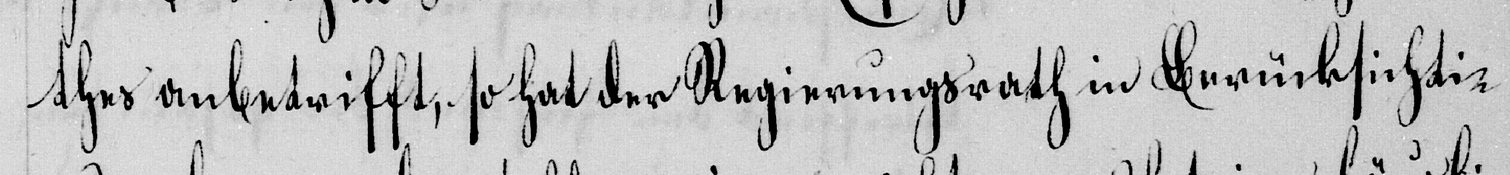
thes anbetrifft, so hat der Regierungsrath in Berücksichti¬
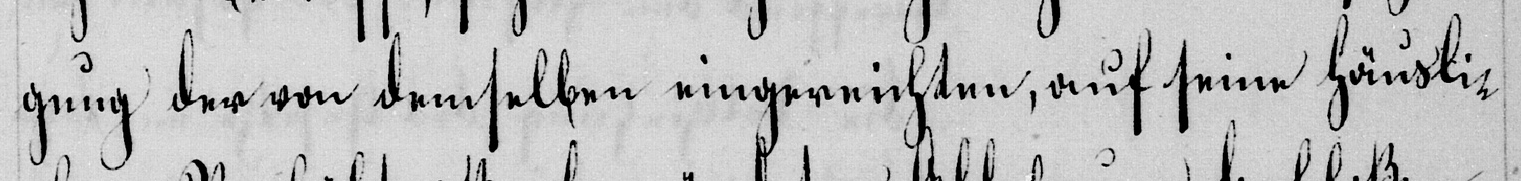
gung der von demselben eingereichten, auf seine häusli¬
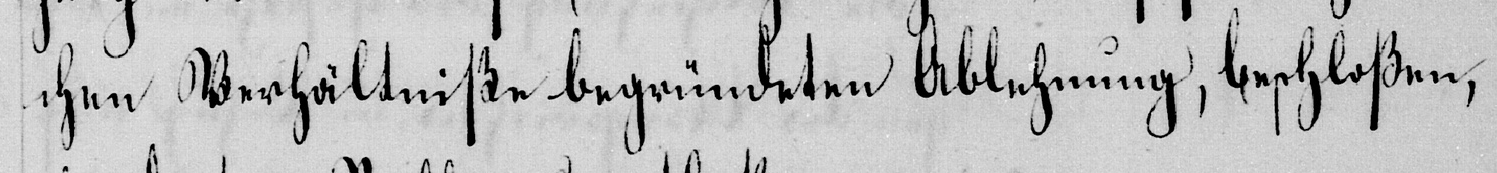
chen Verhältniße begründeten Ablehnung, beschloßen,
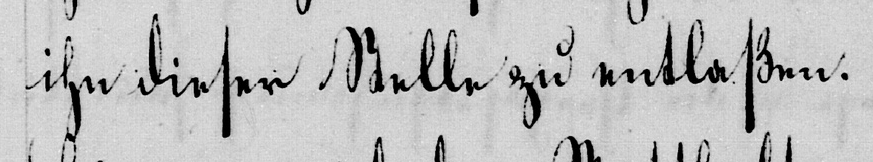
ihn dieser Stelle zu entlaßen.
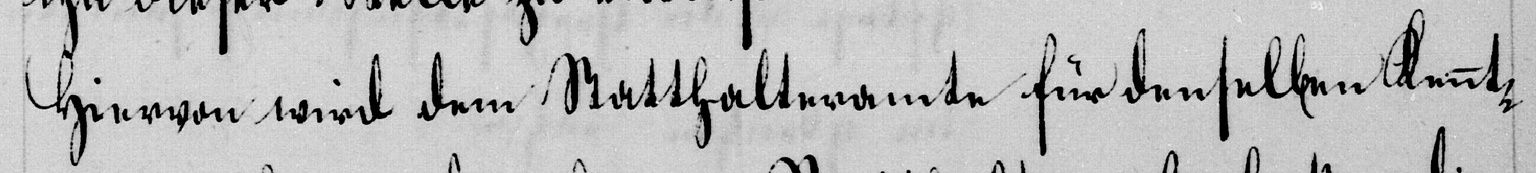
Hiervon wird dem Statthalteramte für denselben Kennt¬
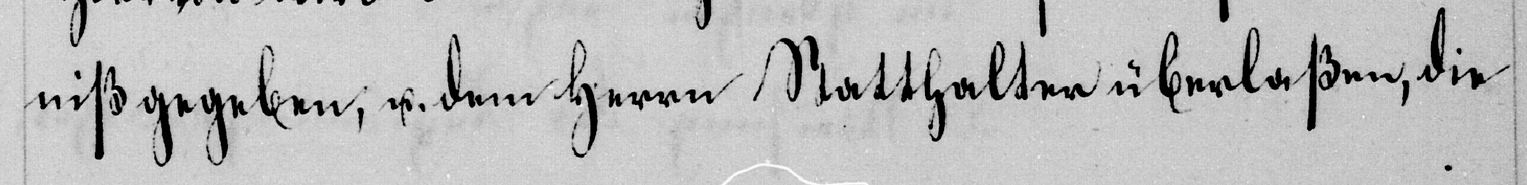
niß gegeben, u. dem Herrn Statthalter überlaßen, die
